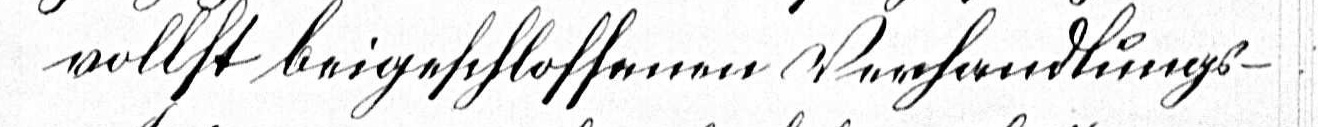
wollft beigeschlossenen Verhandlungs-
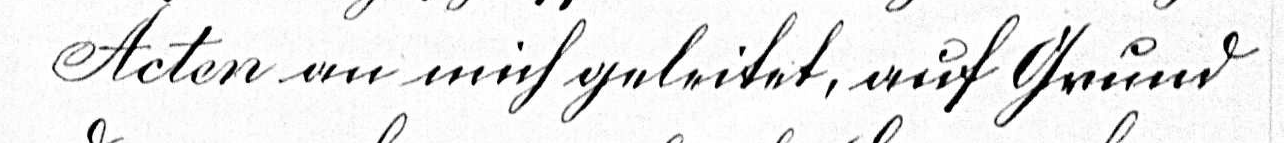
Acten an mich geleitet, auf Grund
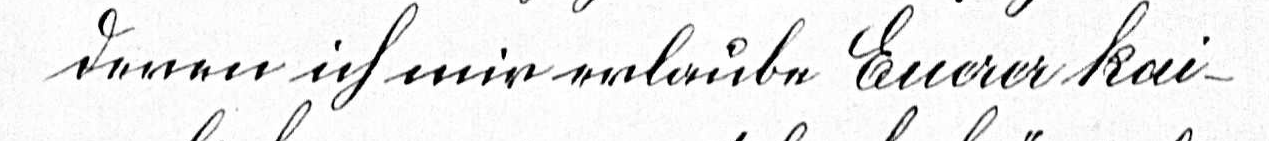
deren ich mir erlaube Euerer kai¬
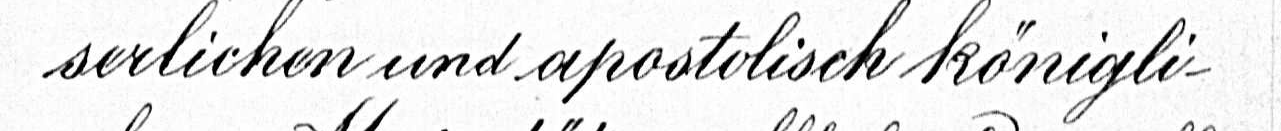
serlichen und apostolisch königli¬
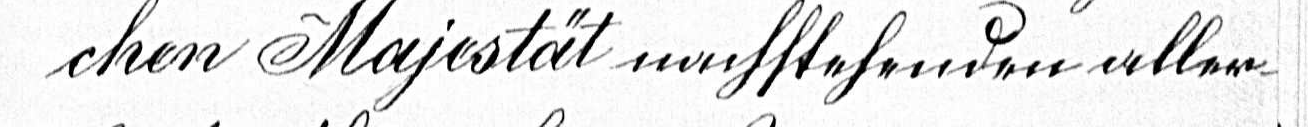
chen Majestät nachstehenden aller¬
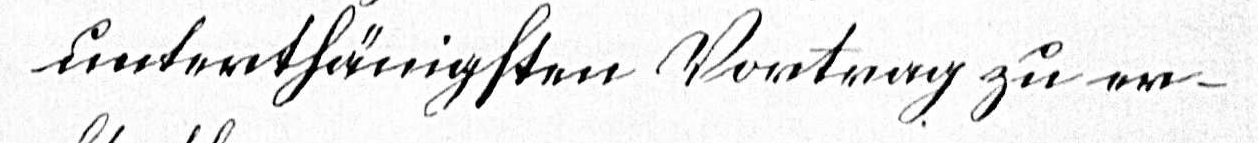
unterthänigsten Vortrag zu er¬
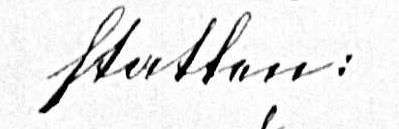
statten:
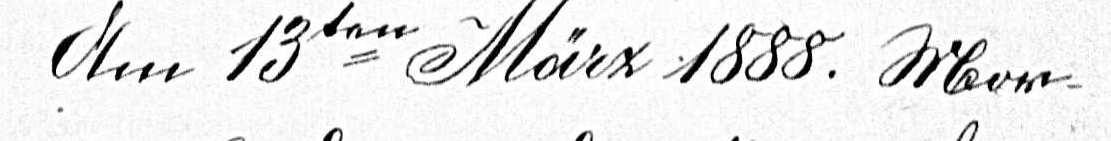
Am 13ten März 1888. Mor¬
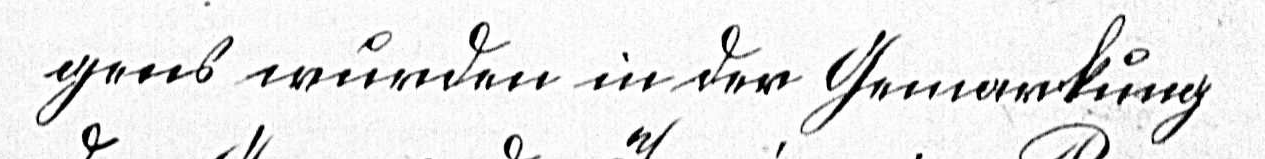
gens wurden in der Gemarkung
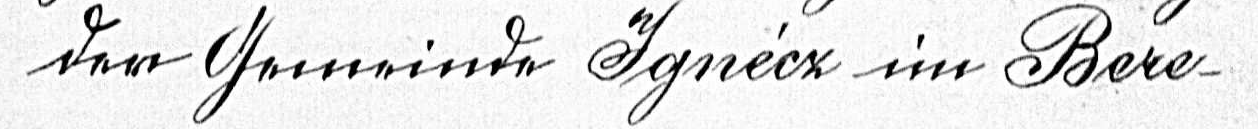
der Gemeinde Jgnécz im Bere¬
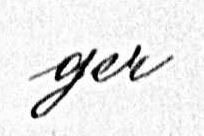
ger
